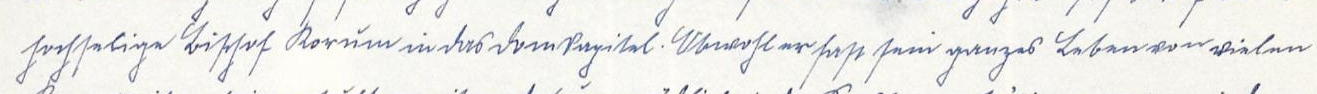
hochselige Bischof Korum in das Domkapitel. Obwohl er fast sein ganzes Leben von vielen
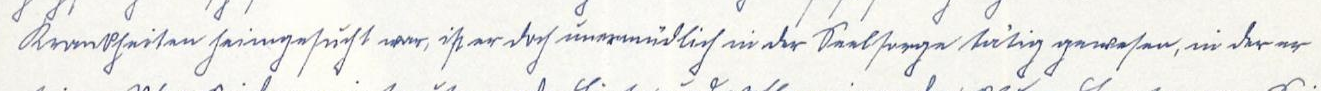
Krankheiten heimgesucht war, ist er doch unermüdlich in der Seelsorge tätig gewesen, in der er
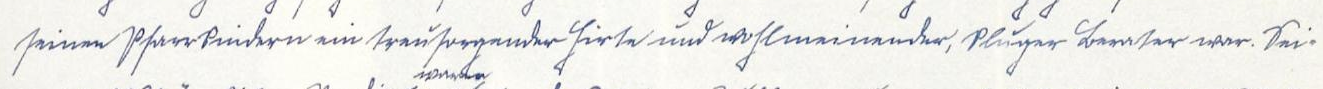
seinen Pfarrkindern ein treusorgender Hirte und wohlmeinender, kluger Berater war. Sei-
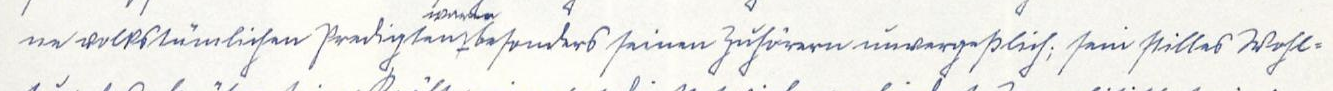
ne volkstümlichen Predigten wurden besonders seinen Zuhörern unvergeßlich; sein stilles Wohl-
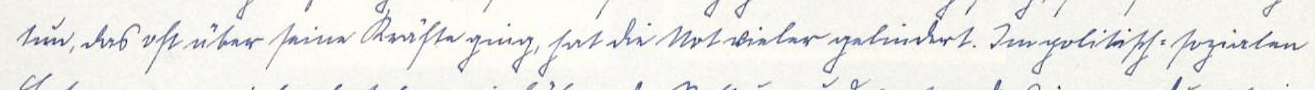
tun, das oft über seine Kräften ging, hat die Not vieler gelindert. Im politisch -sozialen
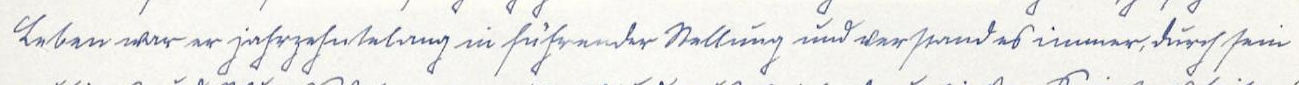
Leben war er jahrzehntelang in führender Stellung und verstand es immer, durch sein
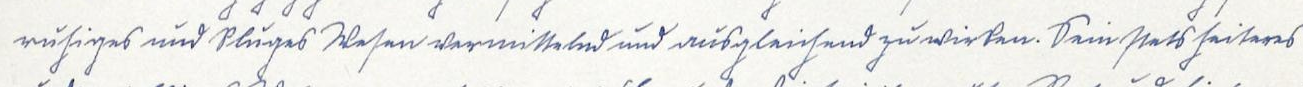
ruhiges und kluges Wesen vermittelnd und ausgleichend zu wirken. Sein stets heiteres
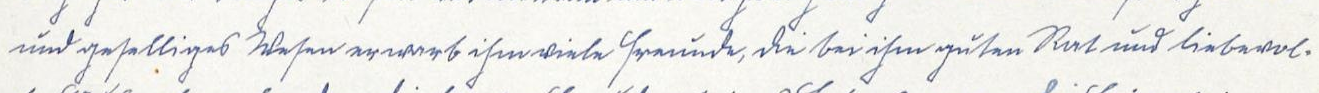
und geselliges Wesen erwarb ihm viele Freunde, die bei ihm guten Rat und liebevol-
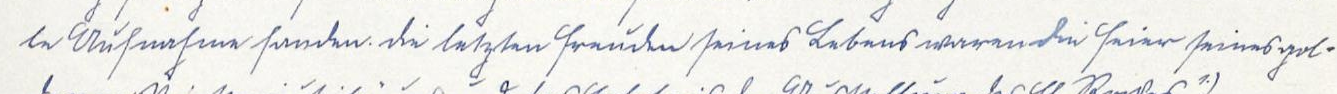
le Aufnahme fanden. Die letzten Freuden seines Lebens waren die Feier seines gol-
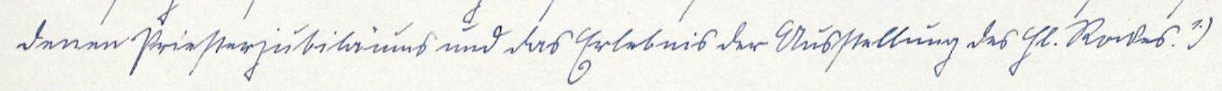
denen Priesterjubiläuns und das Erlebnis der Ausstellung des hl. Rockes- 1)
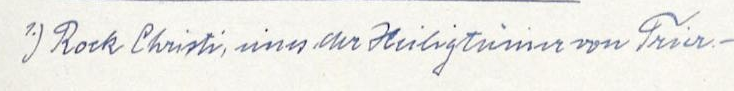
1.) Rock Christi, eines der Heiligtümer von Trier.
